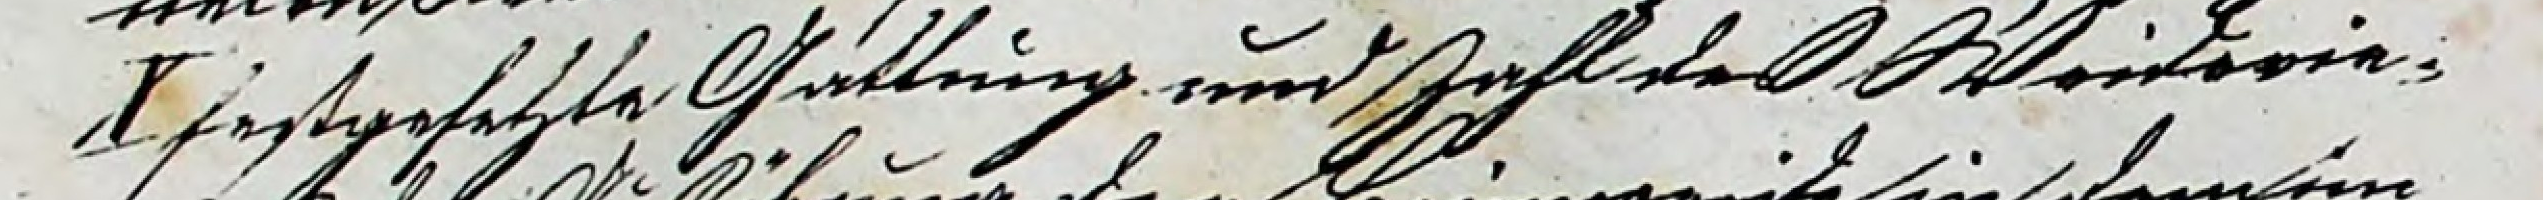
X festgesetzten Gattung und Zahl des Weiderie„
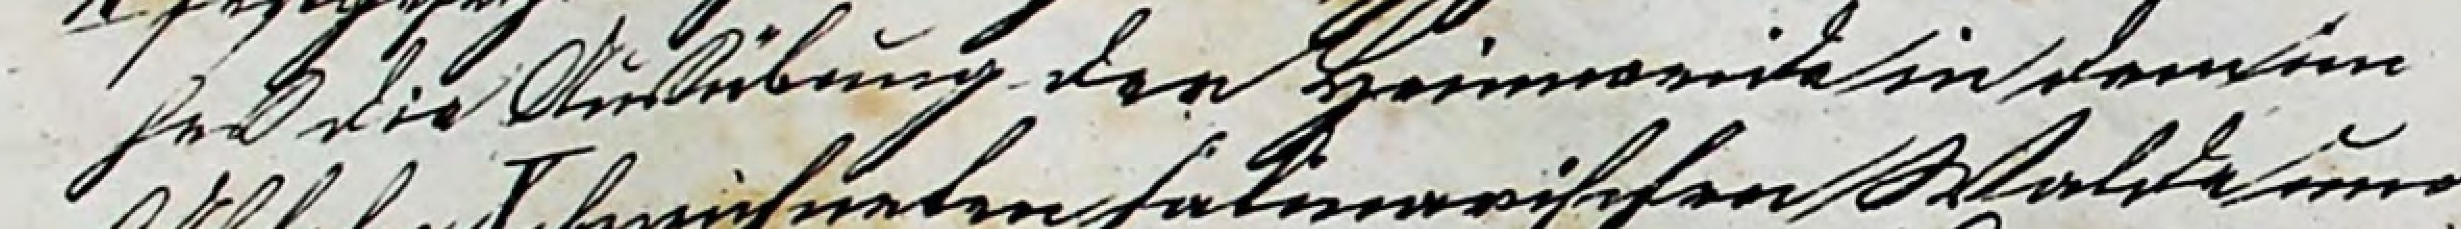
ses die Ausübung der Heimweide in dem im
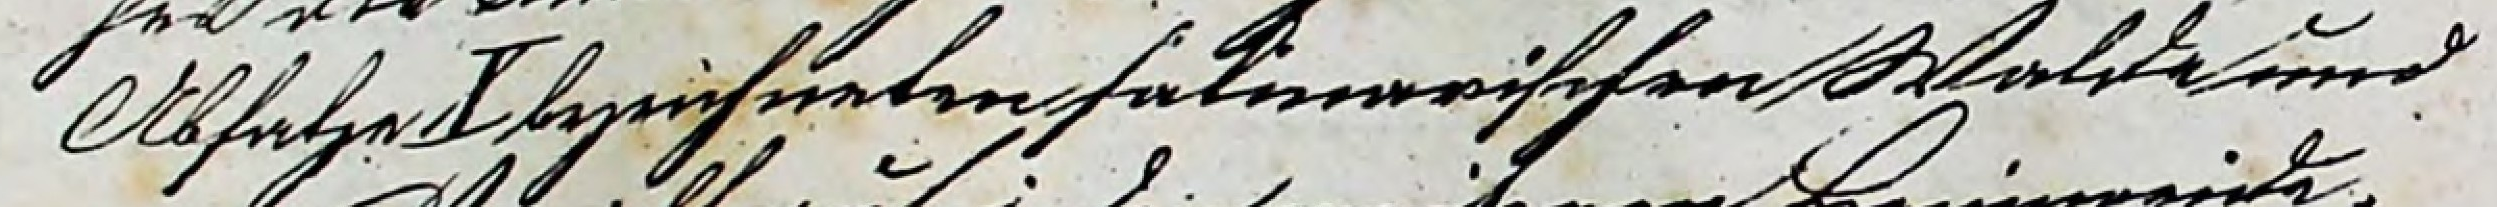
Absatze X bezeichneten falinarischen Walde und
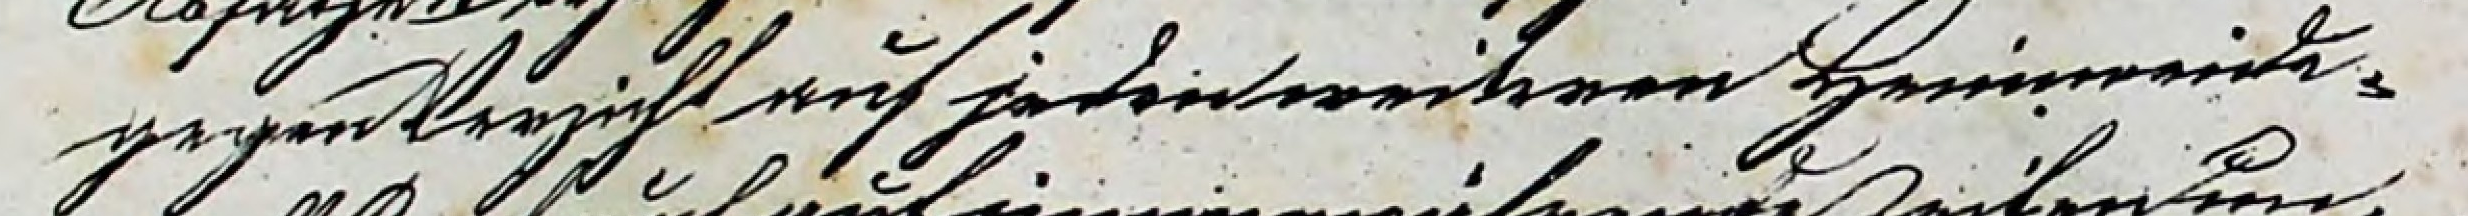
gegen Verzicht auf jeden weiteren Heimweide„
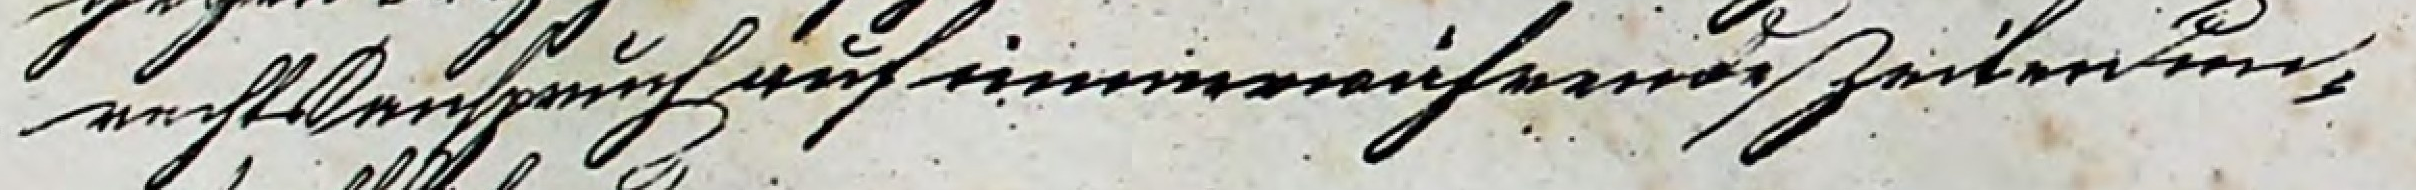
rechtsanspruch auf immer mährende Zeiten un„
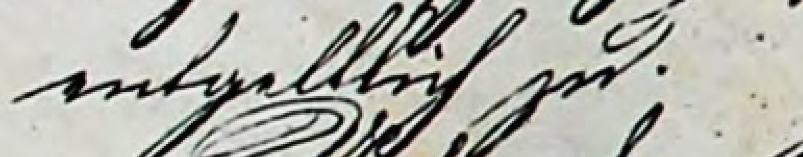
entgeltlich zu.
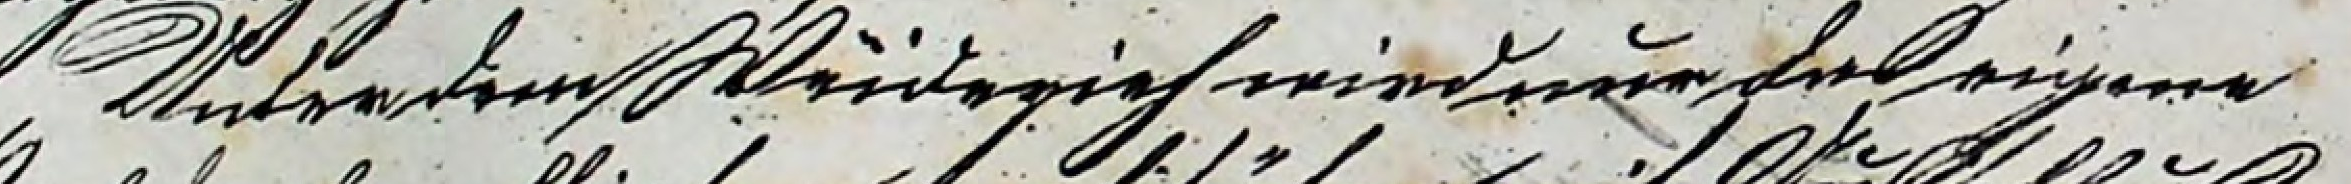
Unter dem Weiderieh wird nur das eigene
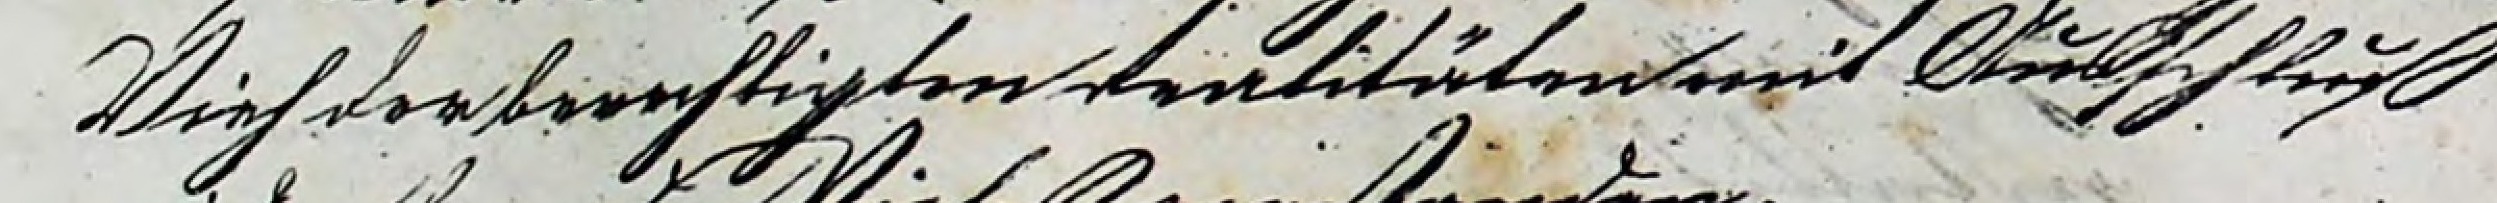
Vieh der berechtigten Realitäten mit Ausschluß
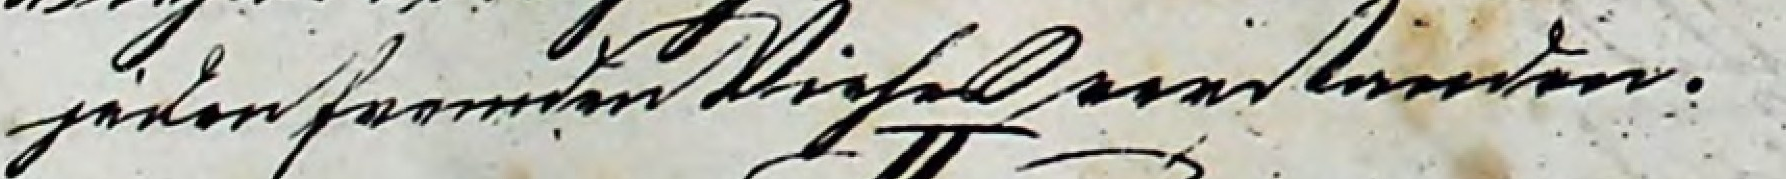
jeden fremden Viehes verstanden.
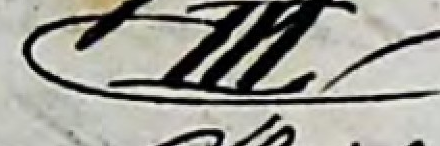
III
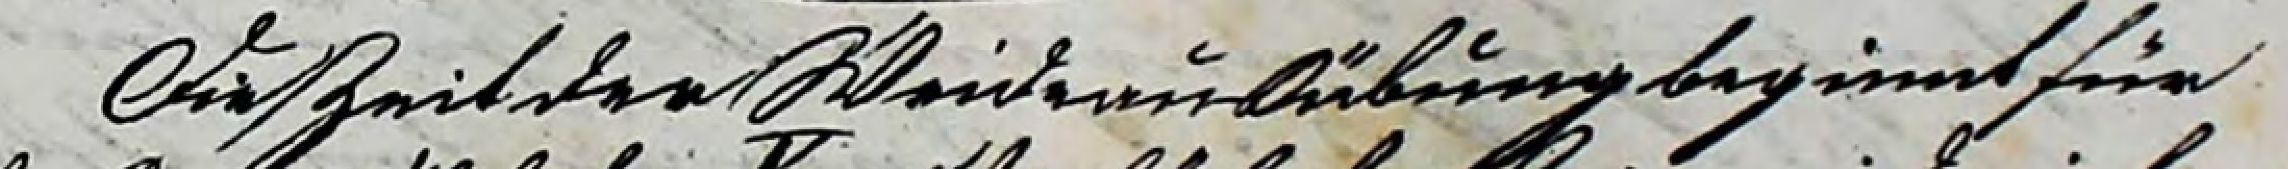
Die Zeit der Weideausübung beginnt für
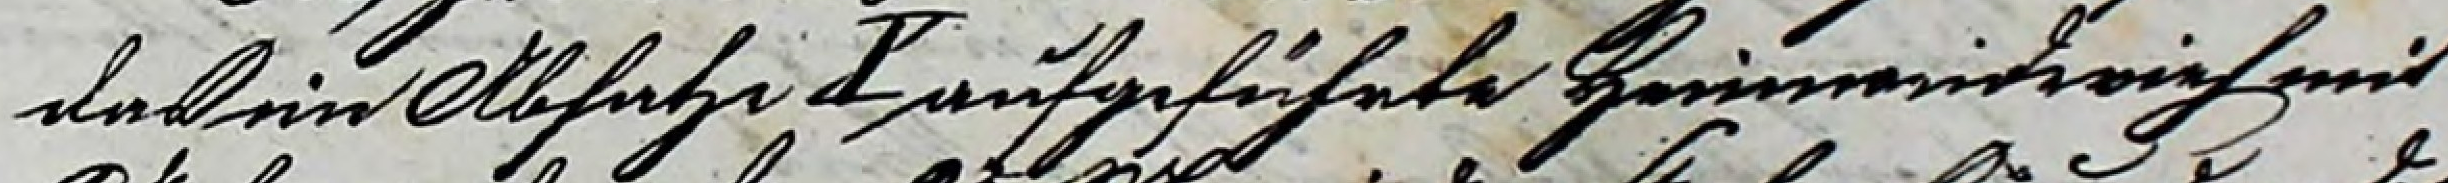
das in Absatze X aufgeführte Heimweiderieh mit
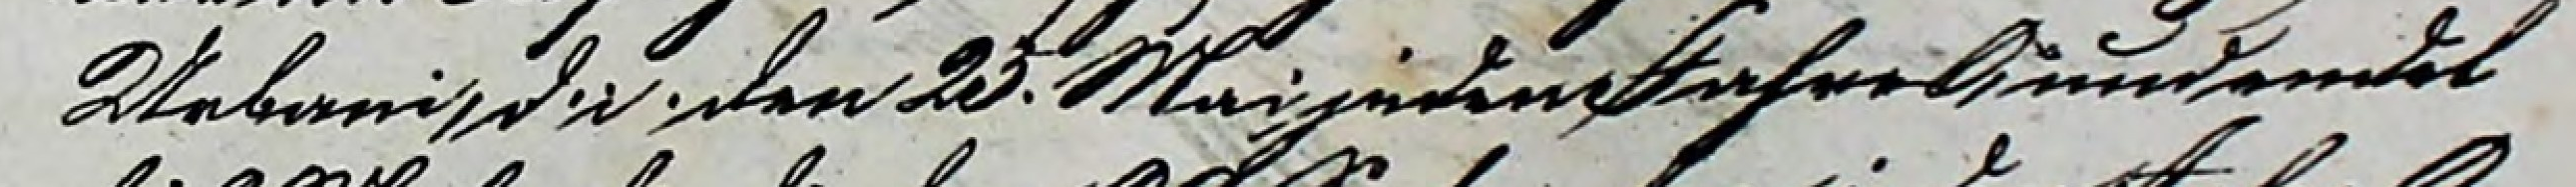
Urbani, d.i. den 23. Mai jeden Jahres, und endet
